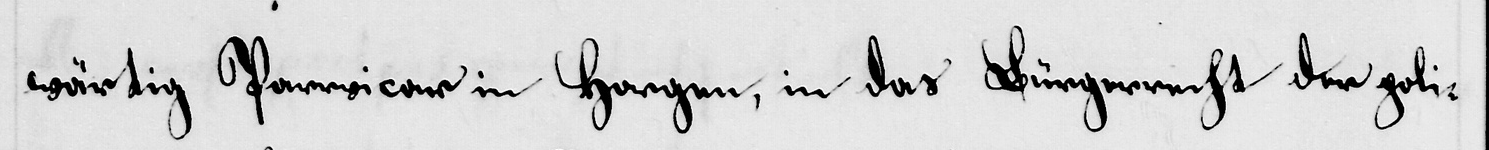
wärtig P[f]arrvicar in Horgen, in das Bürgerrecht der poli¬
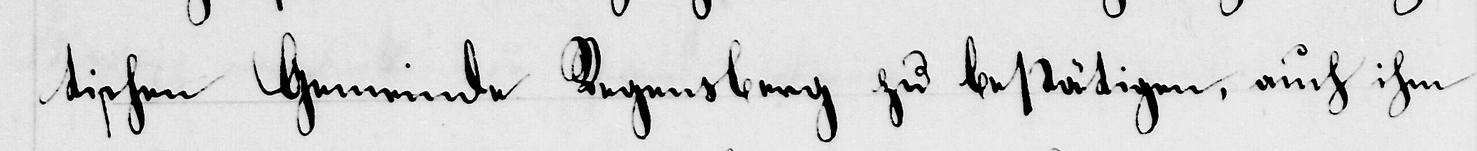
tischen Gemeinde Regensberg zu bestätigen, auch ihm
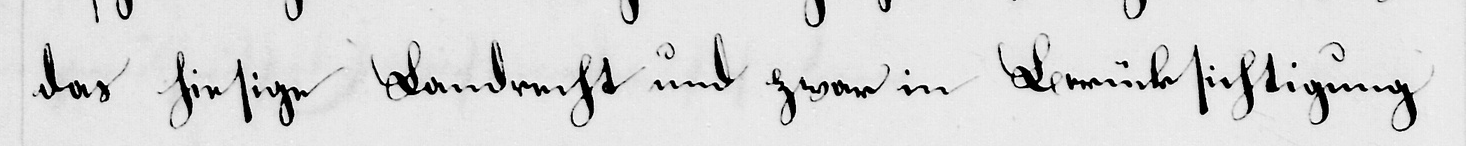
das hiesige Landrecht und zwar in Berücksichtigung
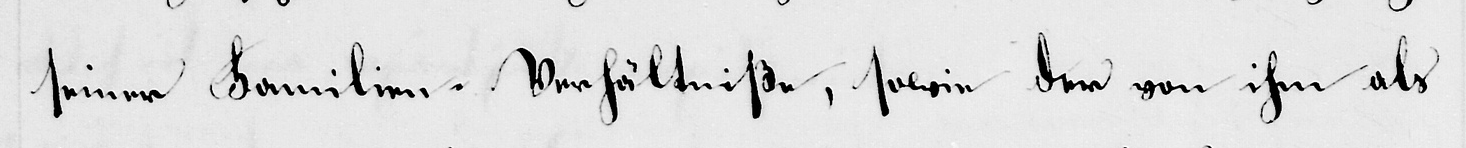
seiner Familien-Verhältniße, sowie der von ihm als
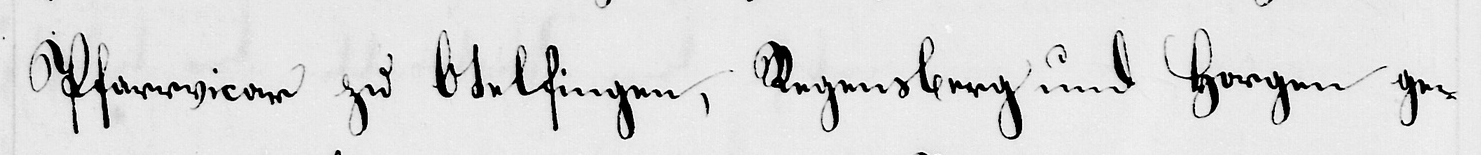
Pfarrvicar zu Otelfingen, Regensberg und Horgen ge¬
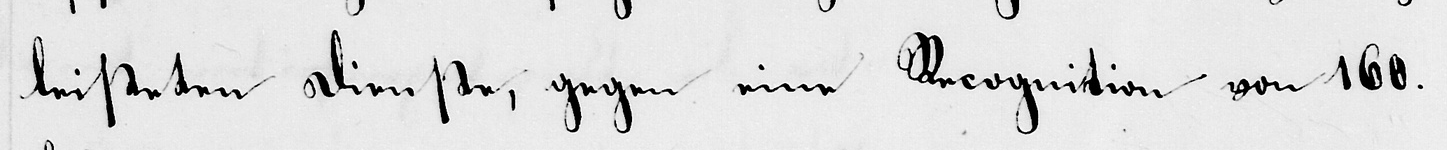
leisteten Dienste, gegen einen Recognition von 160.
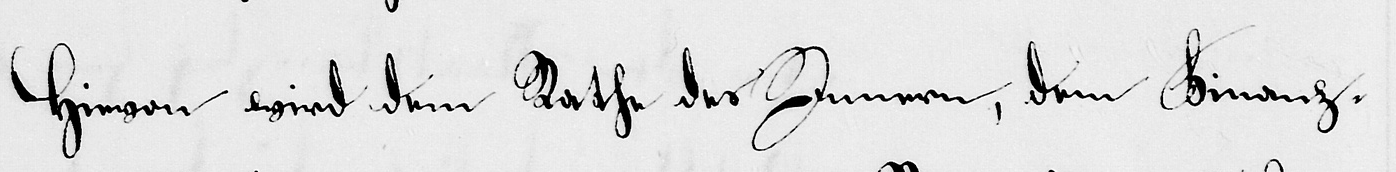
Hievon wird dem Rathe des Innern, dem Finanz¬
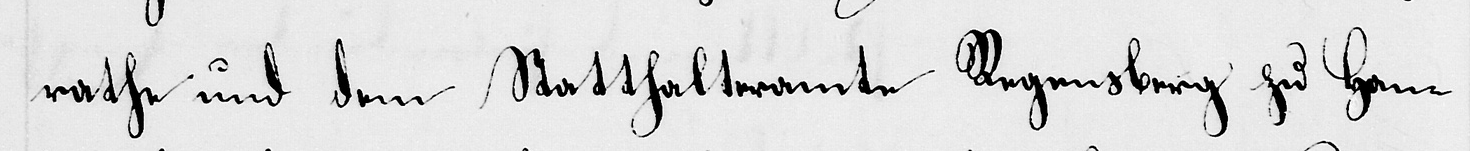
rathe und dem Statthalteramte Regensberg zu Han¬
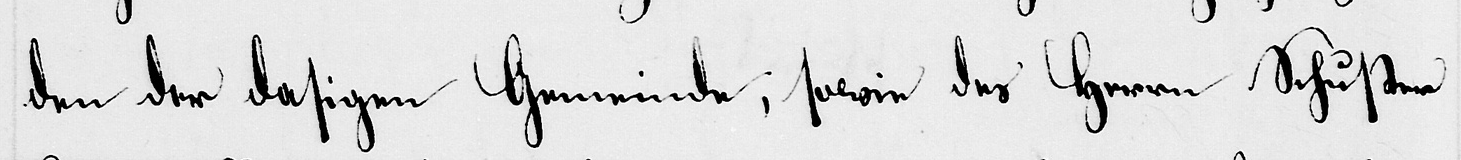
den der dasigen Gemeinde, sowie des Herrn Schuster
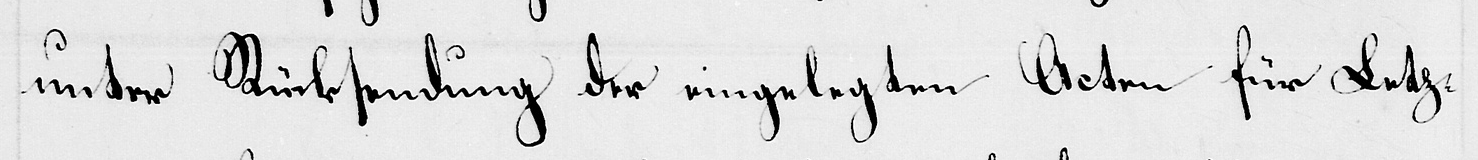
unter Rücksendung der eingelegten Acten für Letz¬
